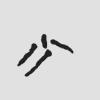少
